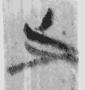之
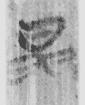晶
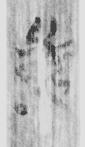尃
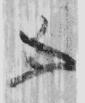之
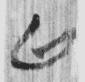㠯（以）
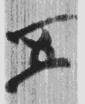五
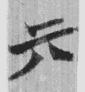亓
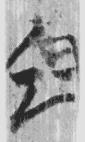侌
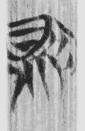則
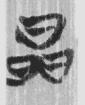晶
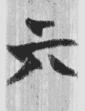亓
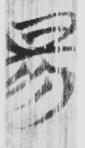昜
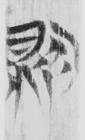則
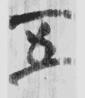五
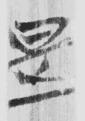是
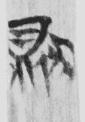則
